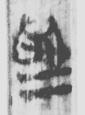爲
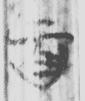百
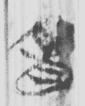眚
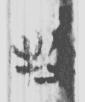牧
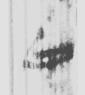㠯（以）
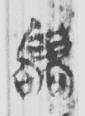臨
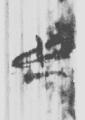民
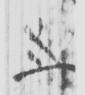之
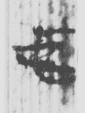𠁩
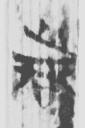者
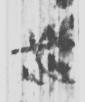必
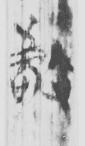敬
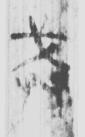戒
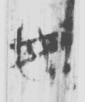母
